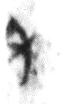利（利）
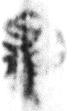則（則）
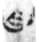自
